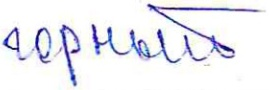горный
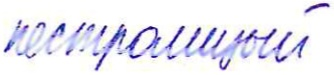пестролицый
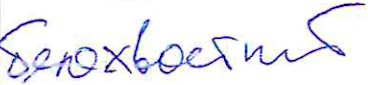белохвостнй
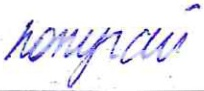попугай
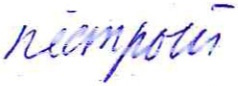пёстрый
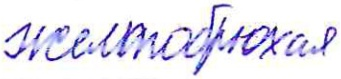желтобрюхая
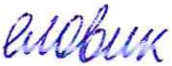еловик
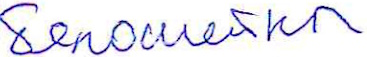белошейка
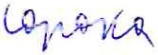сорока
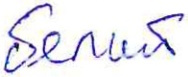белый
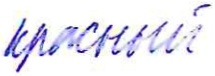красный
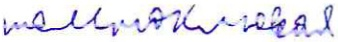толстоклювая
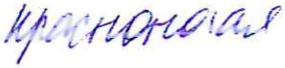краснонаая
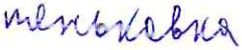теньковка
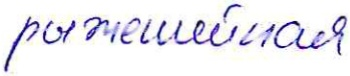рыжешейная
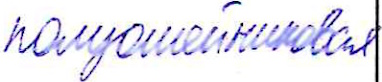полуошейниковая
